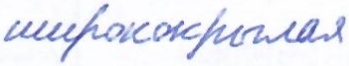ширококрылая
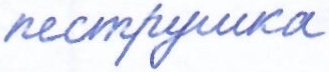пеструшка
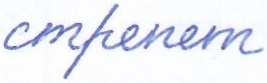стрепет
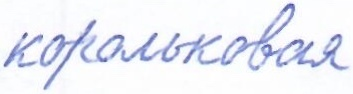корольковая
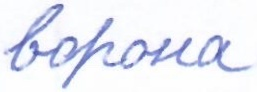ворона
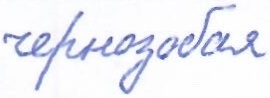чернозобая
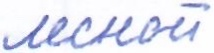лесной
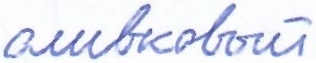оливковый
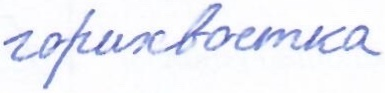горихвостка
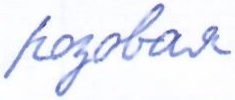розовая
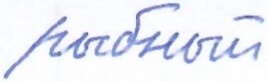рыбный
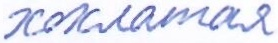хохлатая
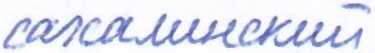сахалинский
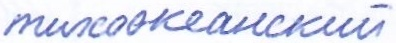тихоокеанский
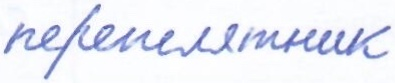перепелятник
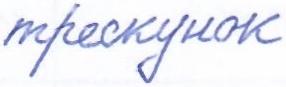трескунок
